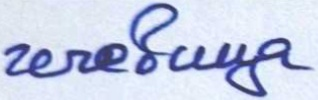чечевица
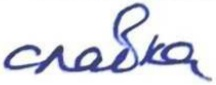славка
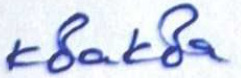кваква
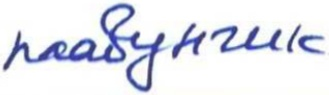плавунчик
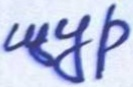щур
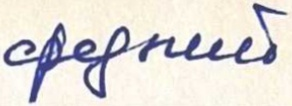средний
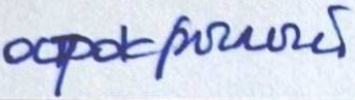острокрылый
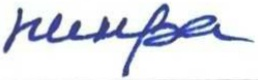нимра
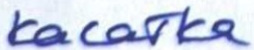касатка
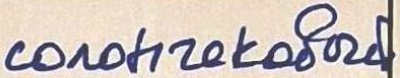солончаковый
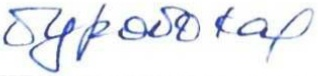буробокая
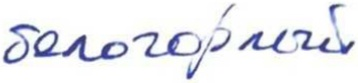белогорлый
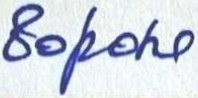ворона
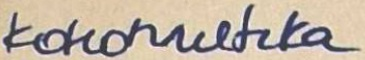коноплянка
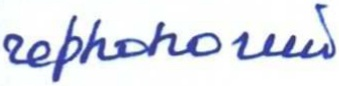черноногий
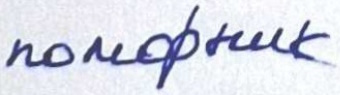поморник
